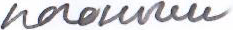погоныш
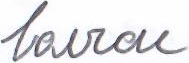волчок
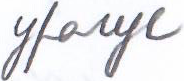урагус
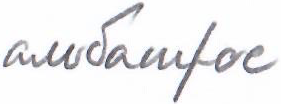альбатрос
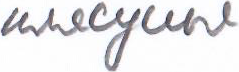плясунья
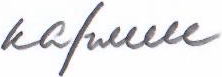карлик
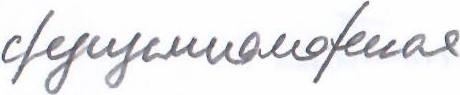средиземноморская
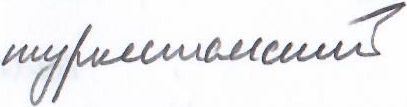туркестанский
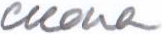скопа
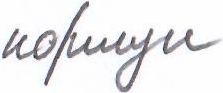коршун
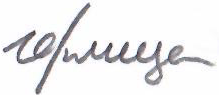горлица
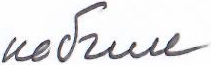кобчик
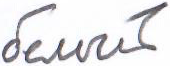белый
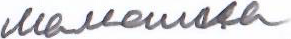малютка
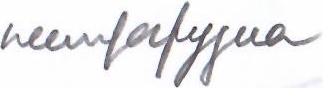пестрогрудка
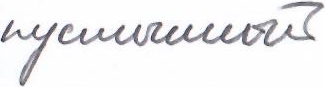пустынный
